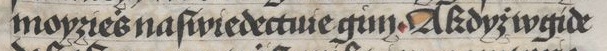moyzieṡ naſwiedectuie gim.A kdyż wgíde
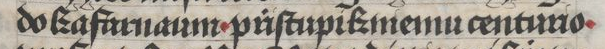do kafarnaum.pṙiſtupi kniemu centurio.
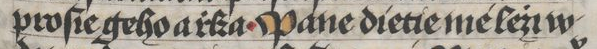proſie geho a ṙka.Pane díetie mé leżi w
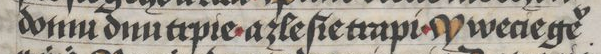domu dnu trpie.a zle ẛie trapí.Y wecie gev
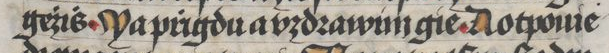geżiṡ.Ya pṙigdu a vzdrawím gie.A otpouie¬
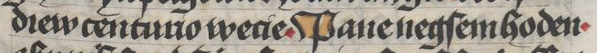diew centurio wecie.Pane negſem hoden.
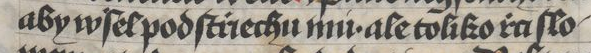aby wẛel podſtṙiechu mú.ale toliko ṙci ſlo¬
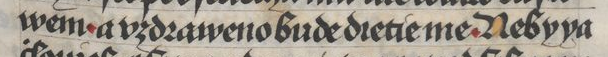wem.a vzdraweno bude dietie me.Neb y ya¬
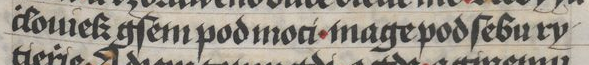ċlouiek gſem pod moci.mage podſebu ry¬
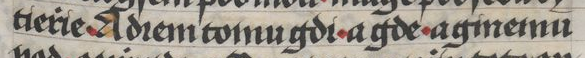tieṙe.A diem tomu gdi.a gde.a ginemu
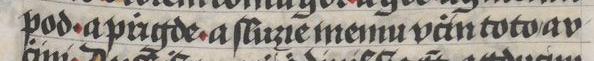pod.a pṙigde.a ſluzie memu vċin toto a v¬
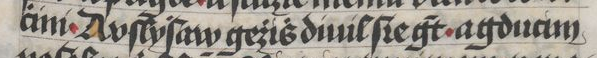ċini.A vſlyẛaw geżíṡ diuil ſie ḡt.a gducim
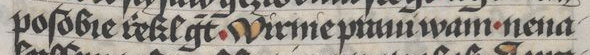poſobie ṙekl ḡt.Wirnie praui wam.nena¬
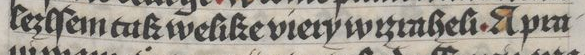lezl ſem tak welike víery w izraheli.A pra¬
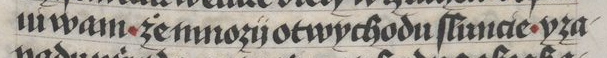ui wam.że mnozij otwychodu ſluncie.y za¬
